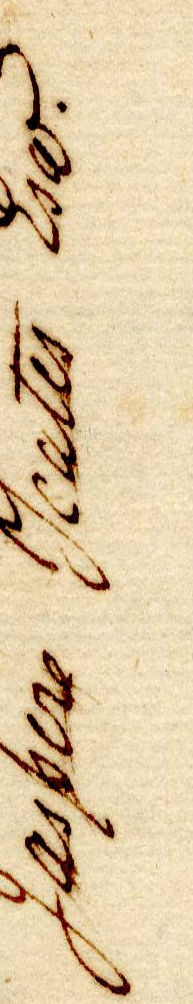Jaspere Yeates Esq.
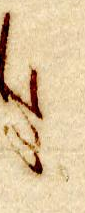at
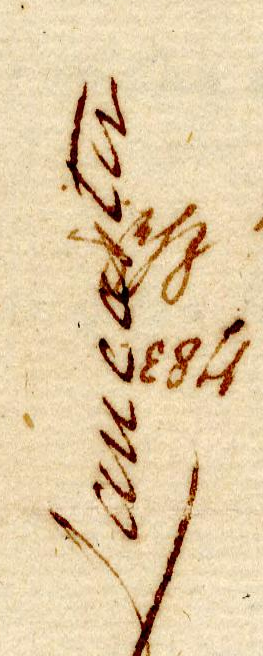Lancaster
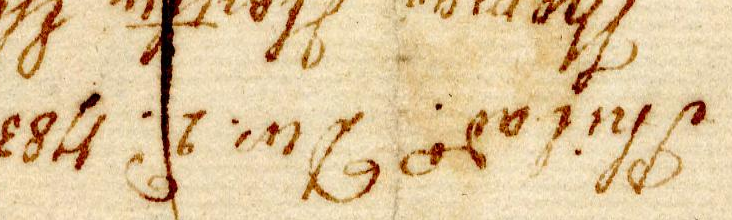Philad^a. Dec^r. 2^d. 1783
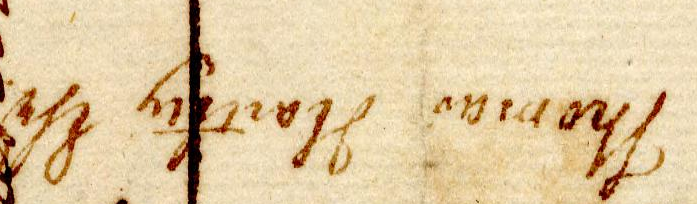Thomas Hartley Esq
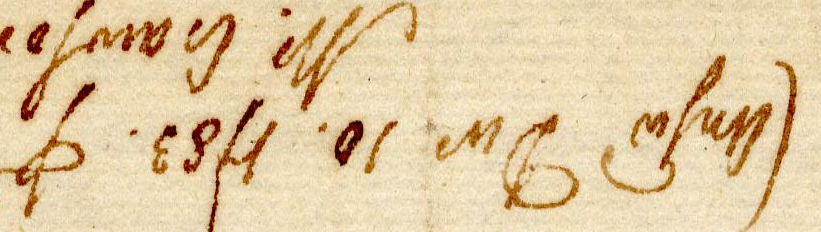(Answ^d Dec^r 10, 1783. per
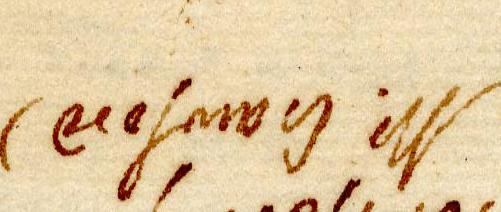Mr. Crawford)
